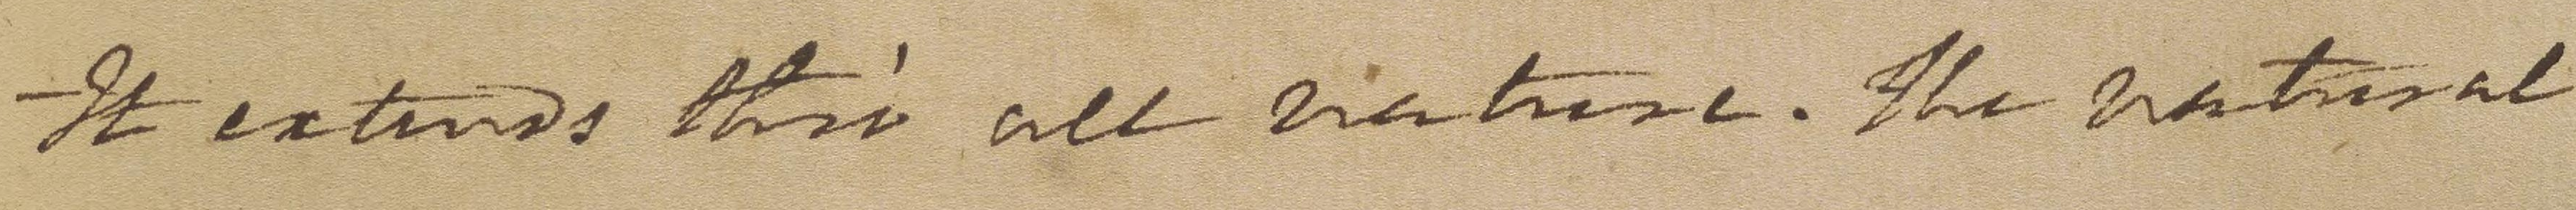It extends this all nature. The natural
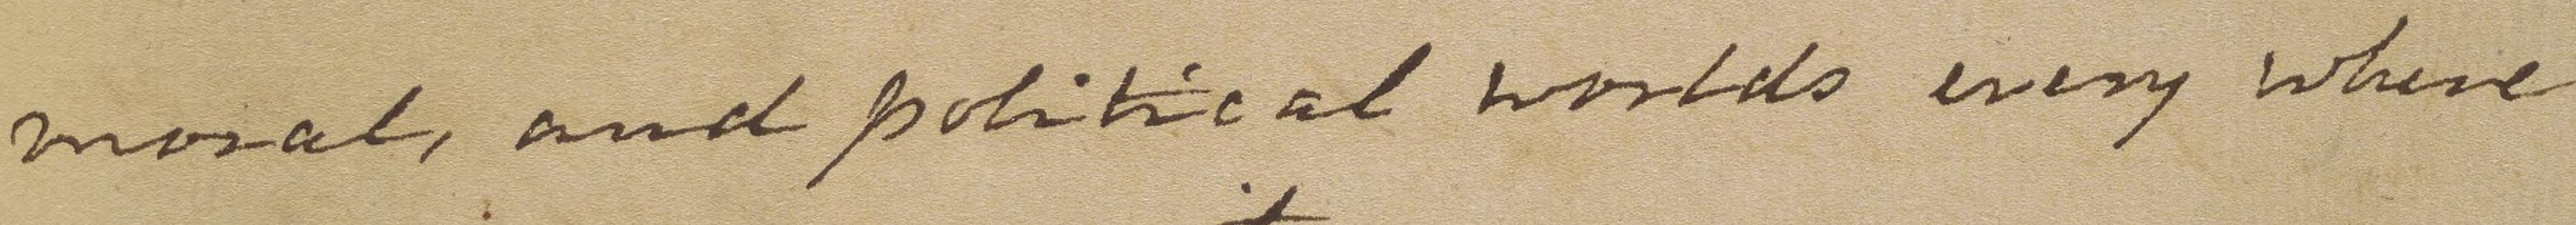moral, and political worlds every where
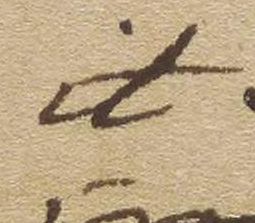it.
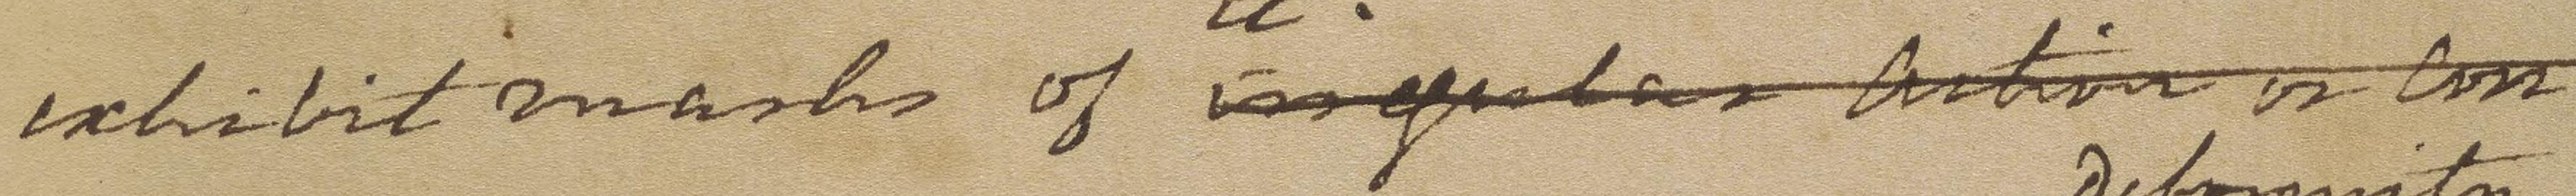exhibit marks of [irregular Action or con-]
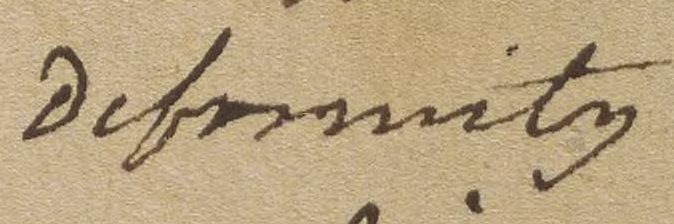deformity
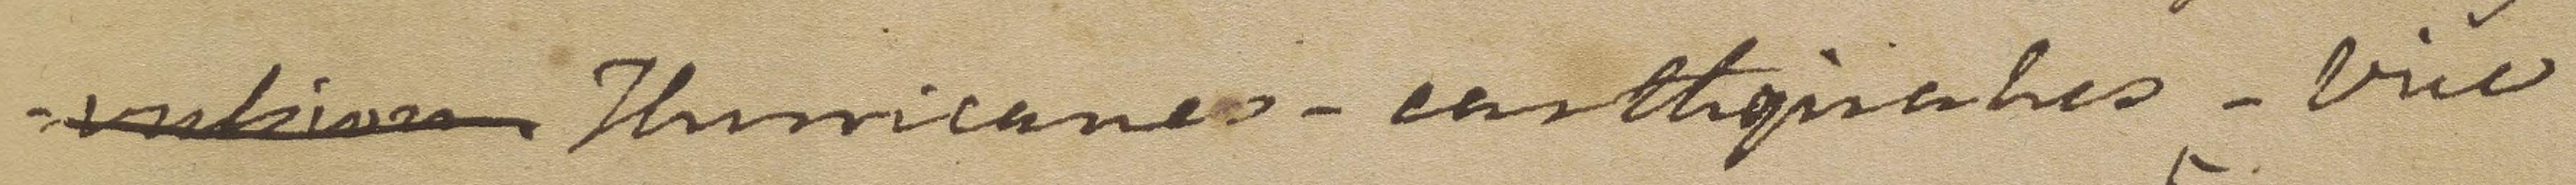[-vulsion]. Hurricanes, earthquakes ^ - evil,
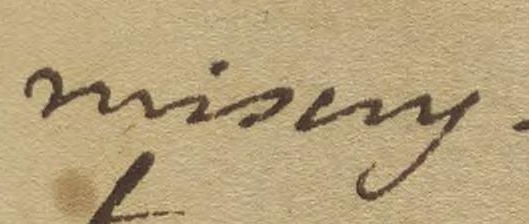misery,
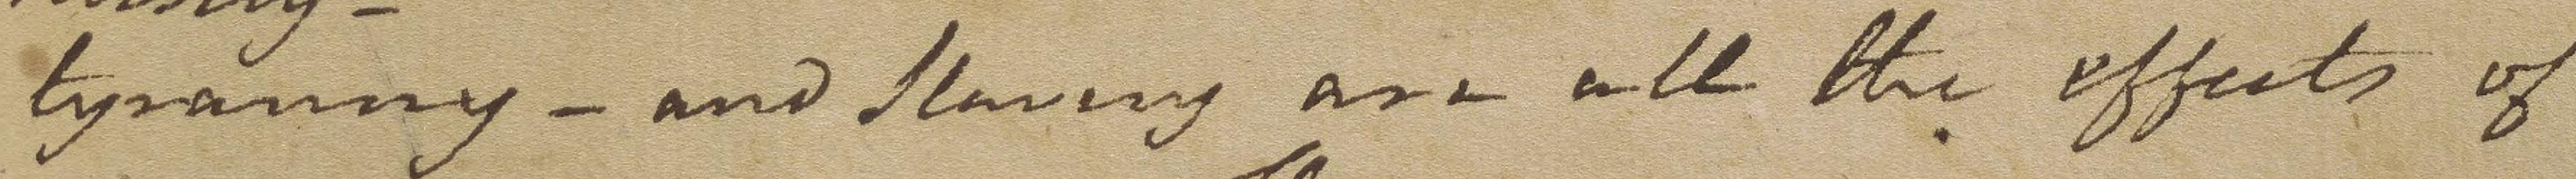tyranny- and slavery all the effects of
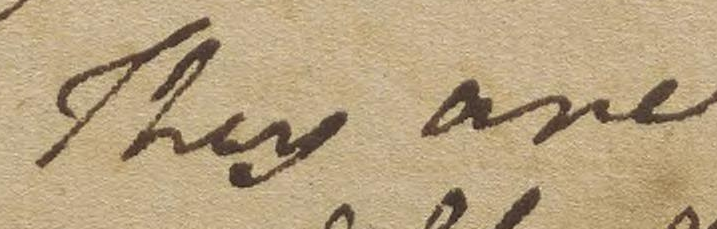They are
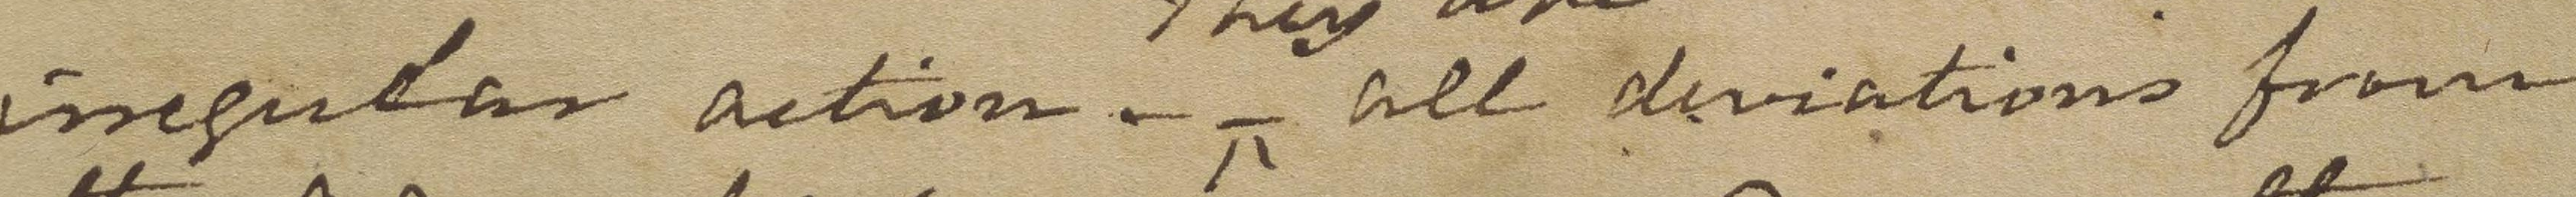irregular action. ^ - all deviations from
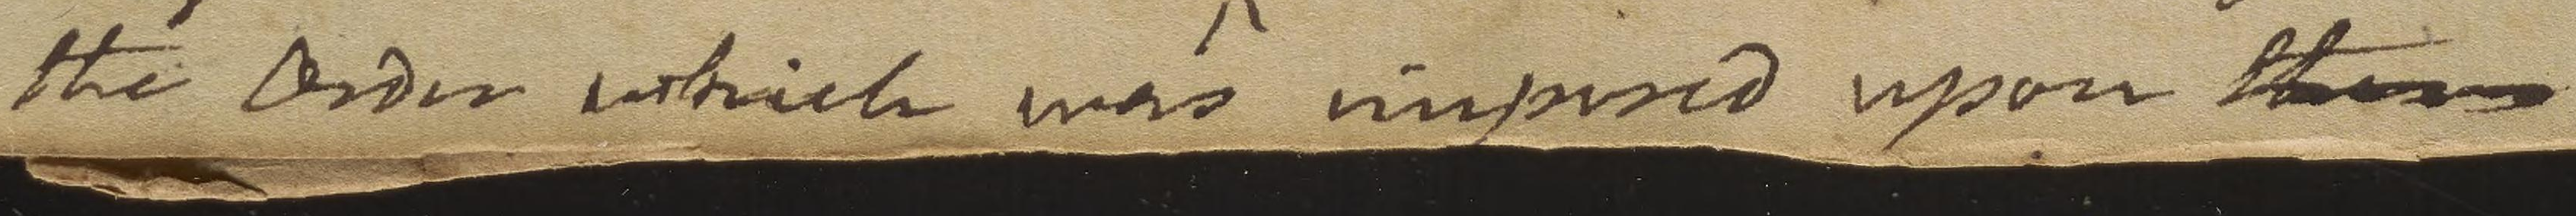the order which was imposed upon the
